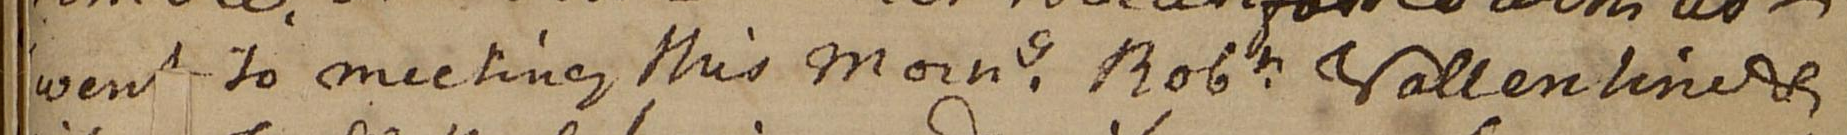went to meeting this morn^g. Rob^t Vallentine &
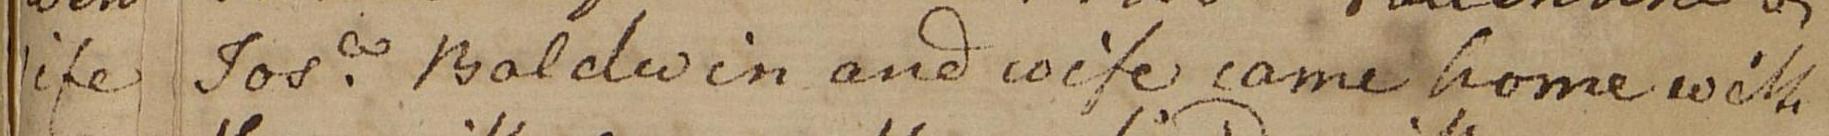[W]ife Jos^a. Baldwin and witf came home with
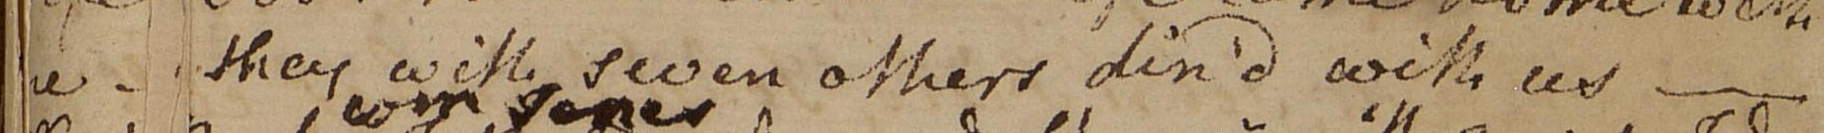re- they with seven others din'd with us-
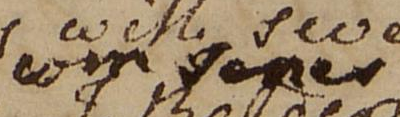W^m Jones
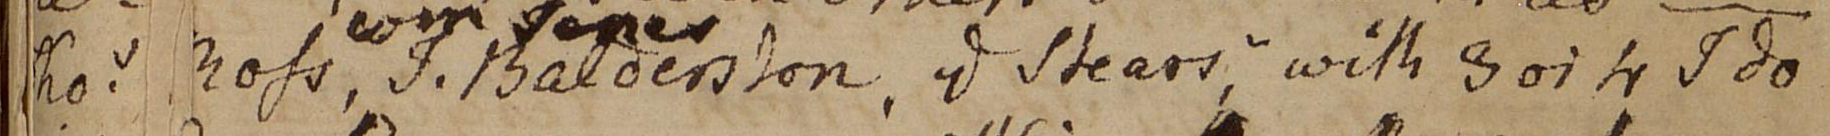Tho.^s Moss, J. Balderston, y^e Stears, with 3 or 4 I do
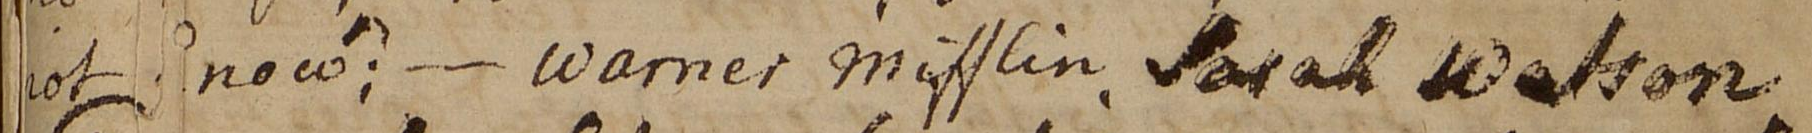[n]ot now;- warner Mifflin, Sarah Watson
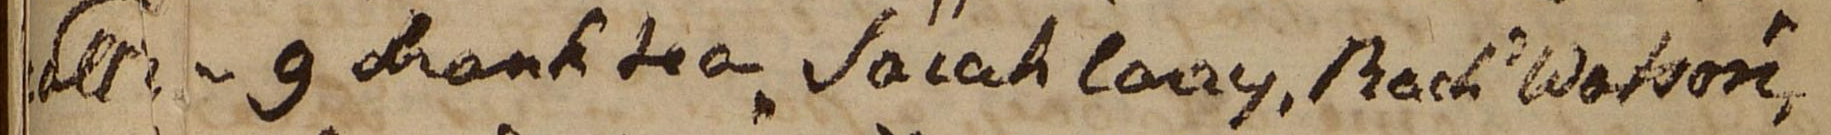[der]- 9 drank tea Sarah lany, Rach^l Watson
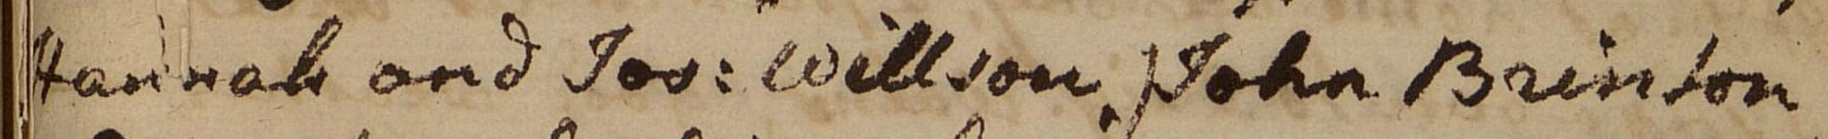Hannah and Jos: Willson, John Brinton
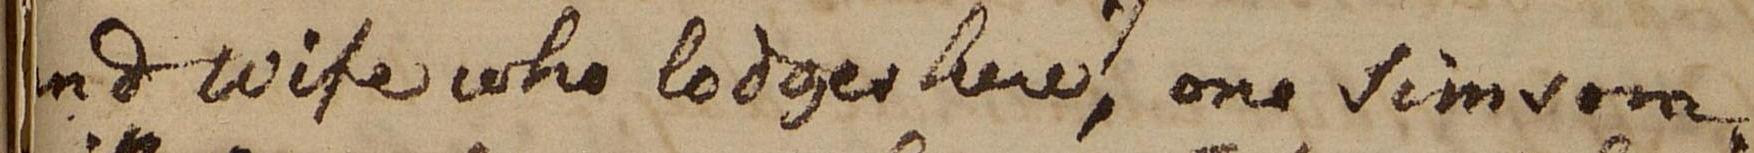and wife who lodges here, one Simsom
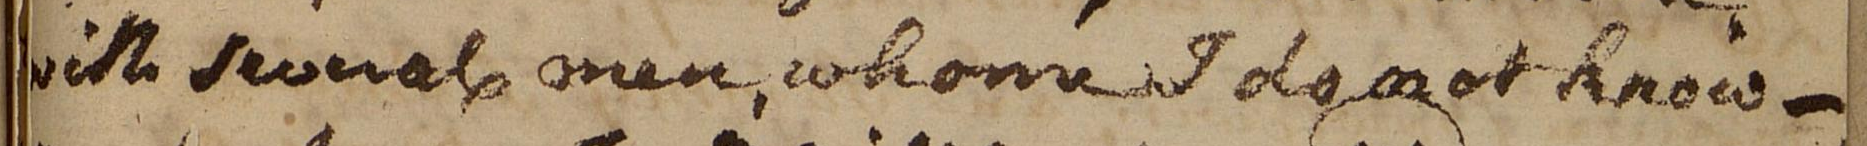with several men, whom I do not know-
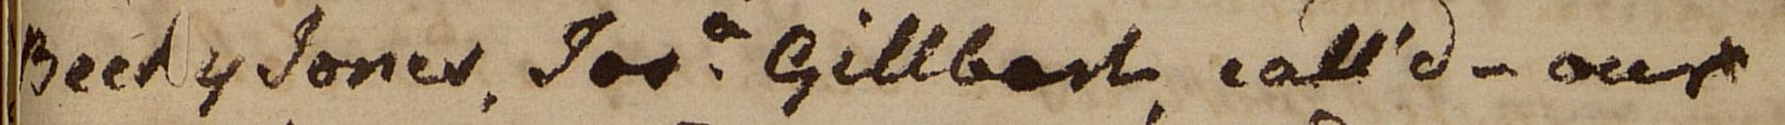Becky Jones, Jos^a. Gillbert, call'd- our
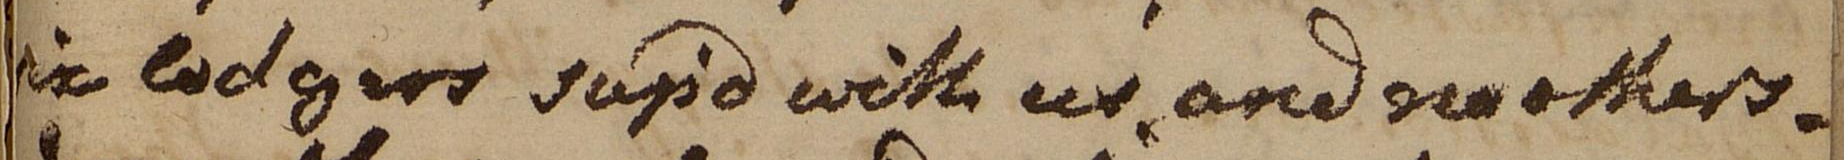[_]ix lodgers sup'd with us, and no others.
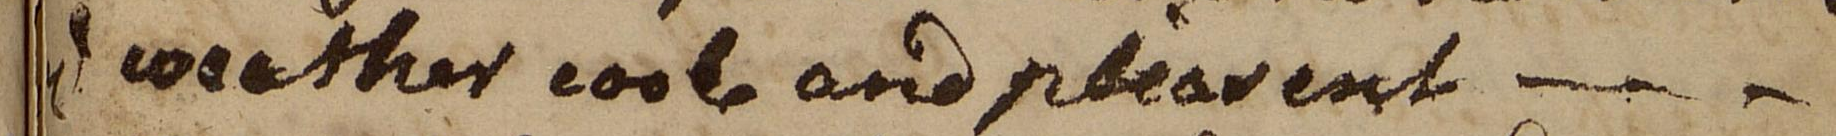weather cool and pleasent--
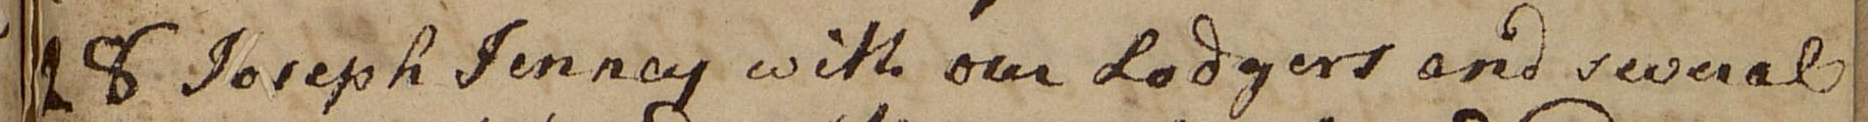28 Joseph Jenney with our Lodgers and several
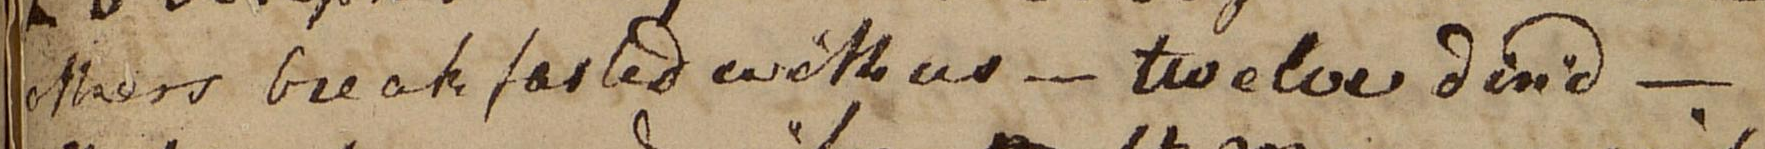others breakfasted with us- twelve din'd-
